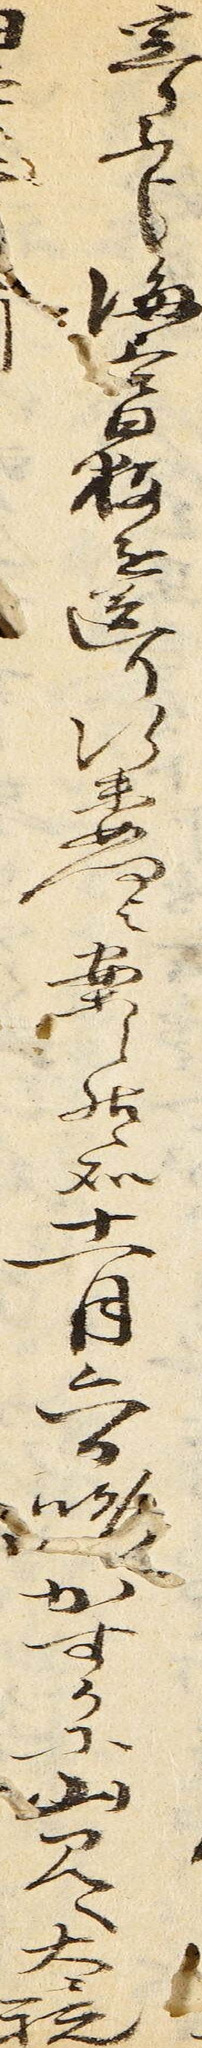定り不申海上に日数を送り行末如何と案し居候処十一月六日晩かすかに山見へ大に祝
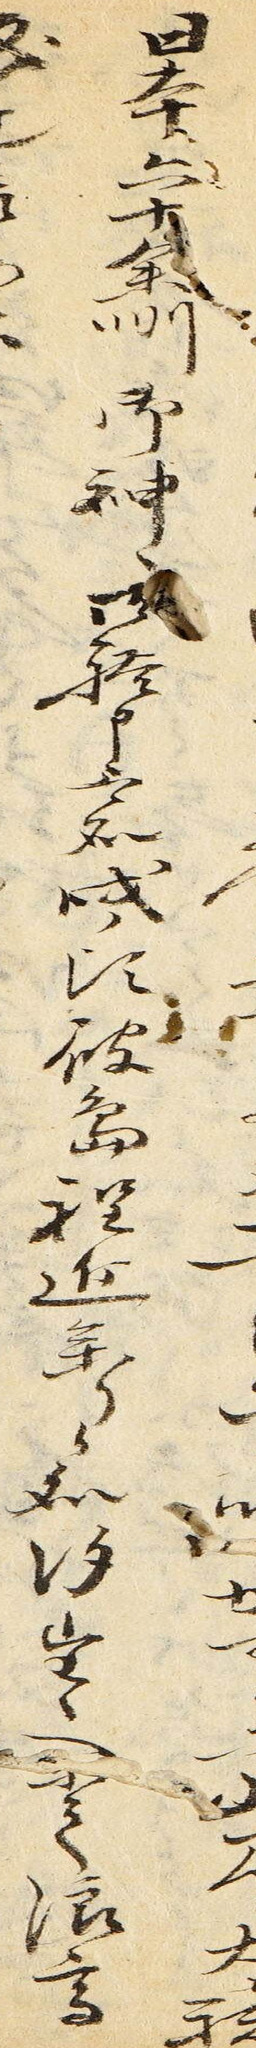日本六十余州御神へ御礼申上候処戌の頃彼島程近参り候処汐たたへにて浪高
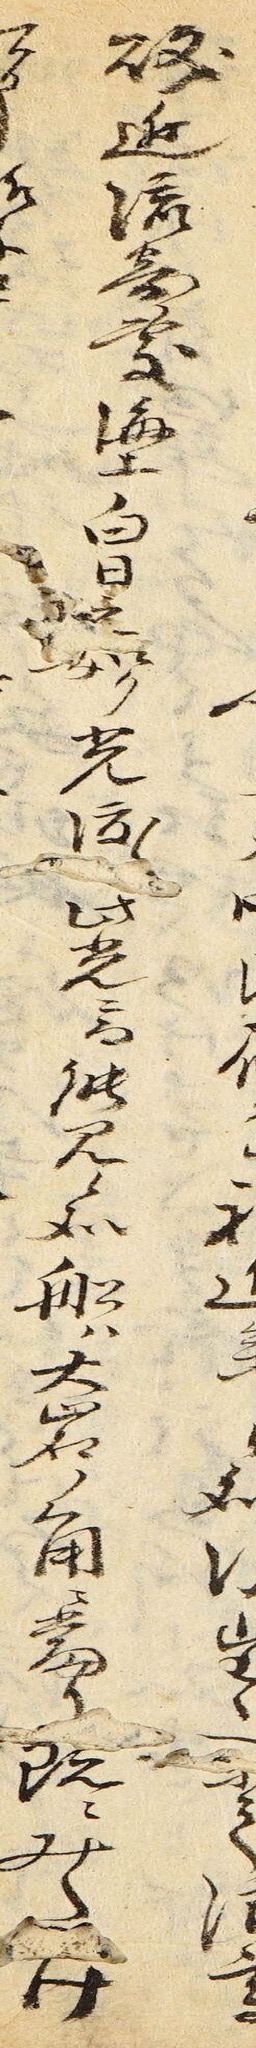磯近流寄処海上白日之如く光渡候此光に而能見候処船は大岩の角に当り既にみたけ
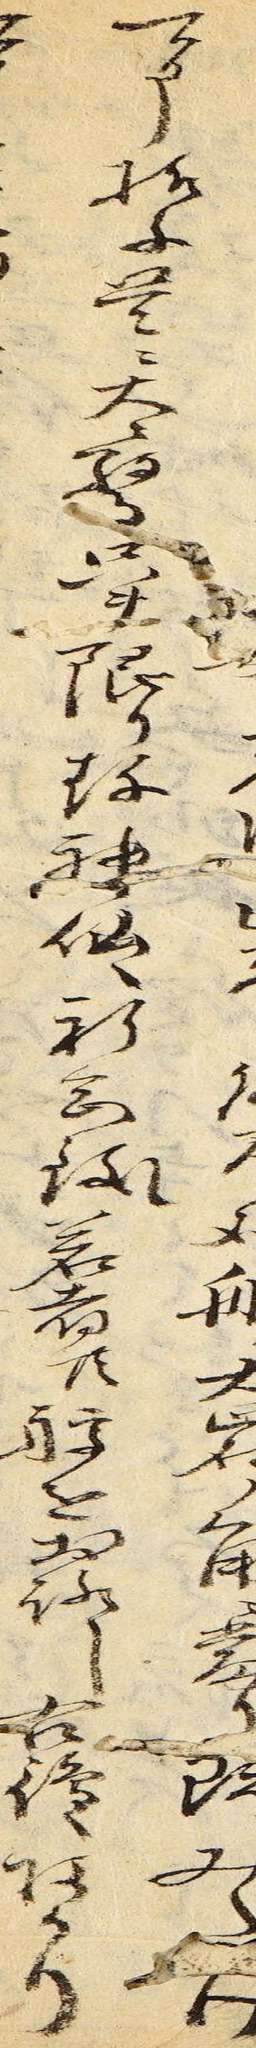可申様子是に大に驚只を限り致神仙へ祈念致候若者共艀をおろし右島へあかり
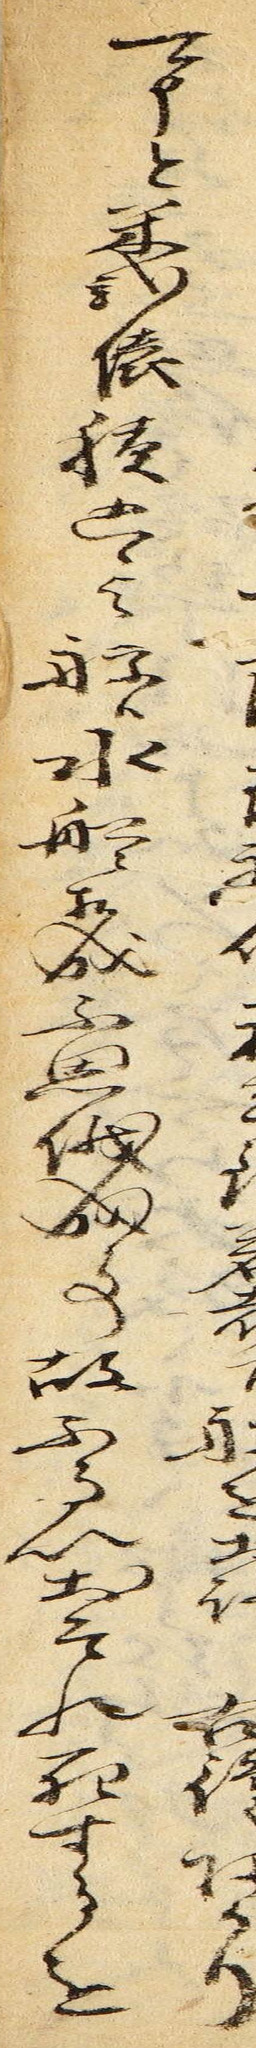可申と米弐俵積込候と艀は水船に相成不思議成事故ふるいおそれ死する

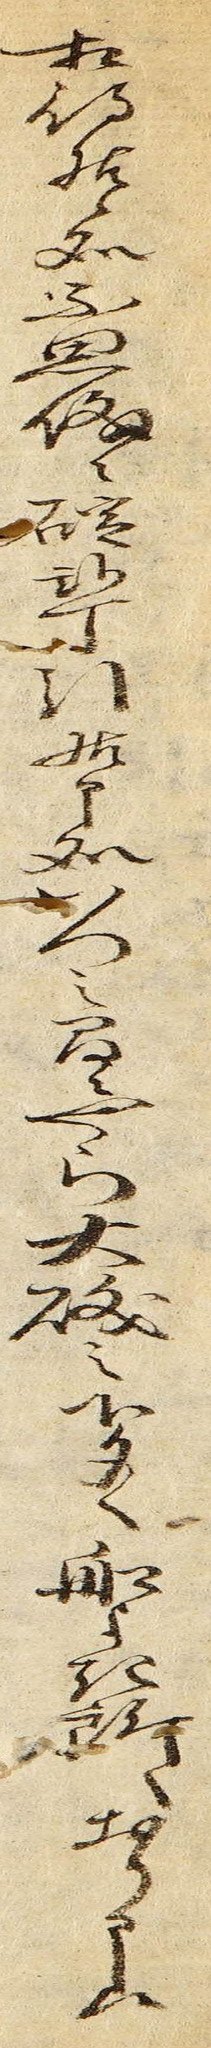相待居候処不思議に碇弐丁引居申処いつ之間にやら大磯之下たへ船よき所へおり申候
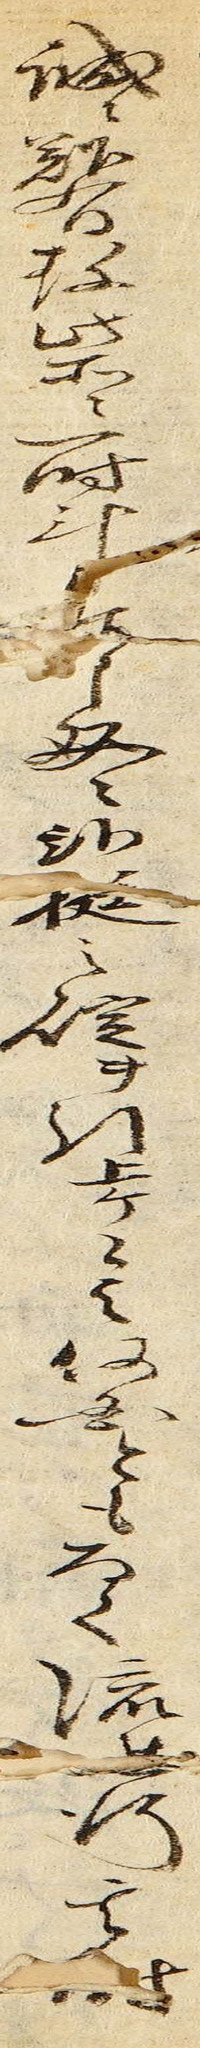誠に難有存此所に一時計り居申又々弐挺之碇を引上けては何国ともなく流れ行其時
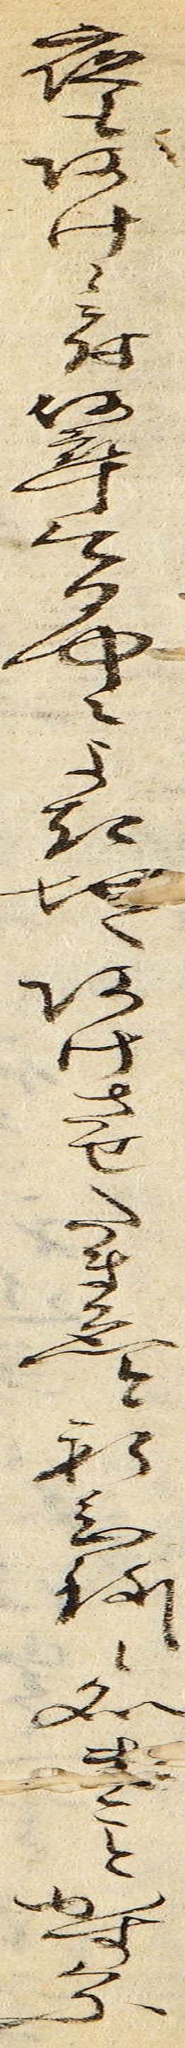夜もあけ候に付何卒今日中によき地へあけさせたまえと祈念致候処まことかすかに
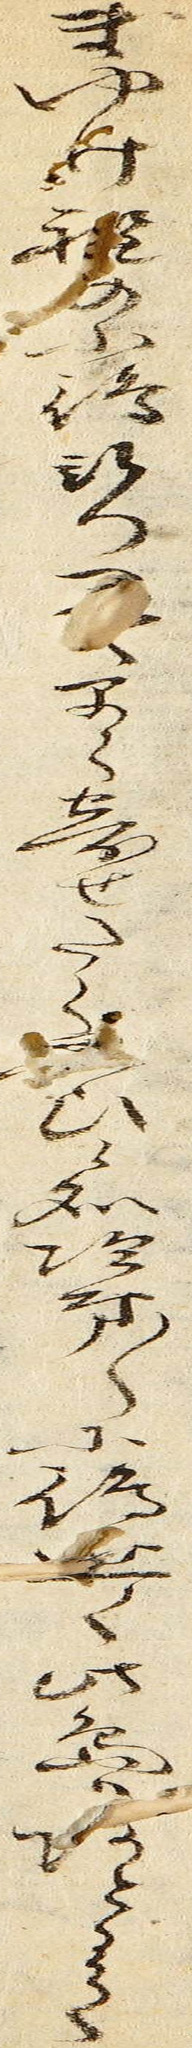まゆけ程の小島弐つ早々寄せたく思ひ候処次第〳〵小島近く此島はあとにて
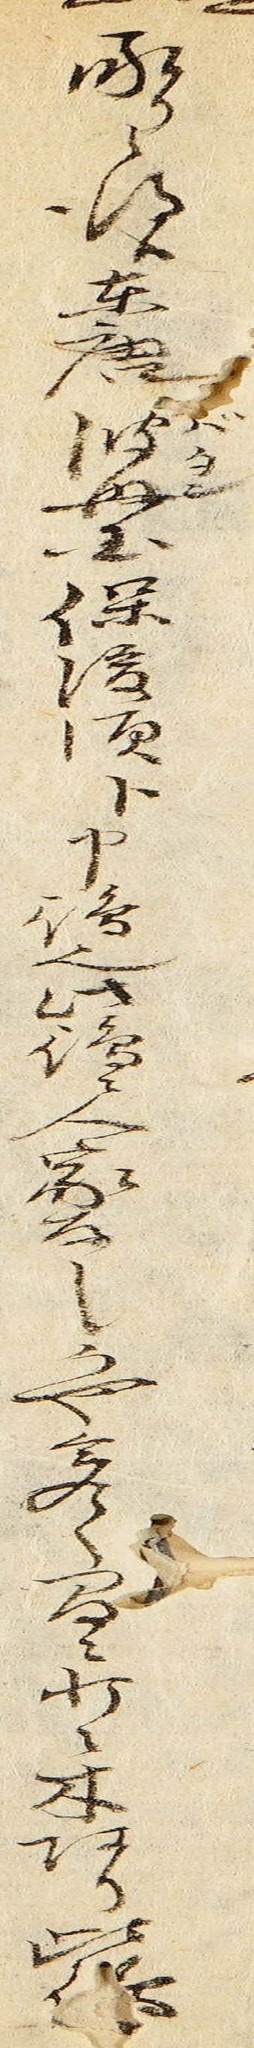承り候得共東唐波丹国保後須と申島也此島に人家なしかや多く間に少々木あり此島
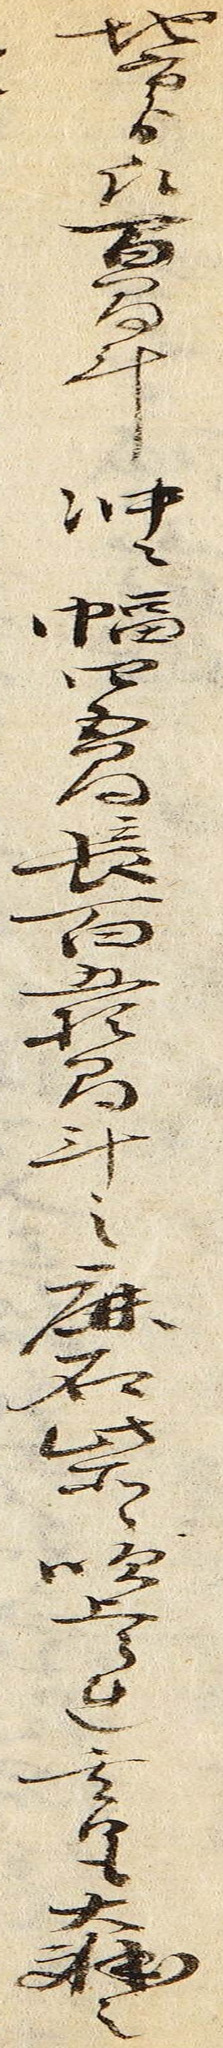地方ゟ凡百間計沖に幅四五間長百五拾間計之鹿石此所へ吹上られ其日も大体之
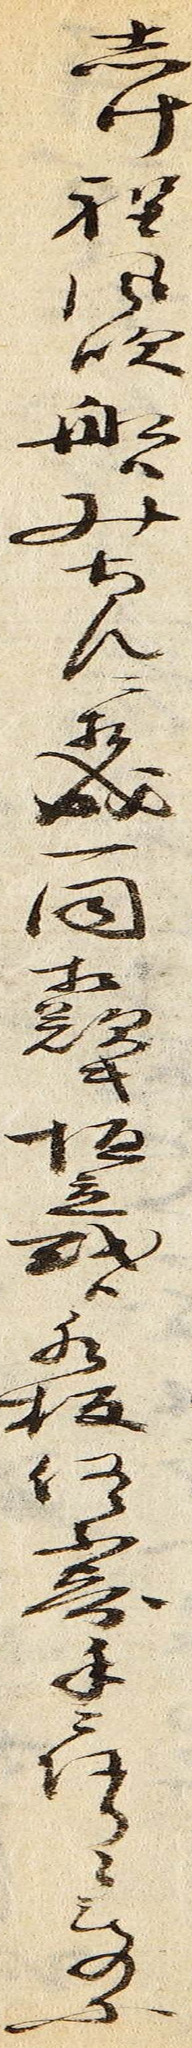しけ程風吹船はみちんに相成一同相歎き垣立或は水板何に不寄手にあり候ものに
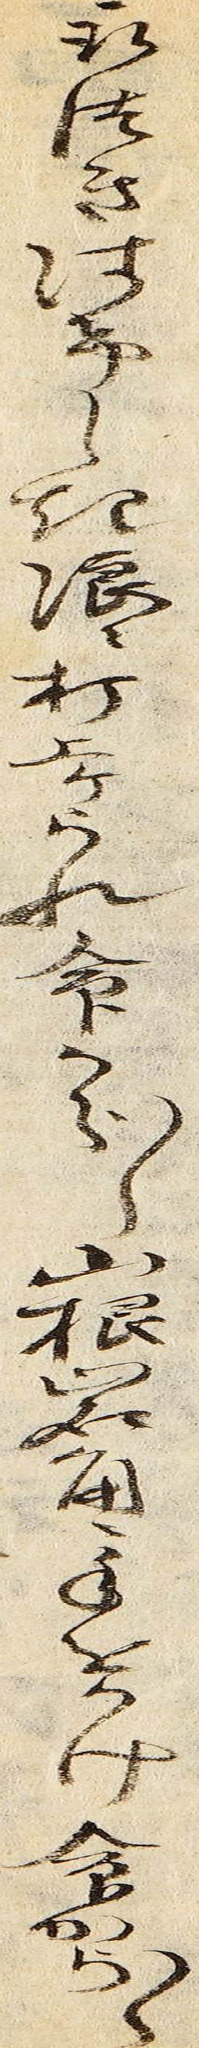取つきはけしき浪に打上けられ命から〳〵山根岩角に手をかけ命から〳〵
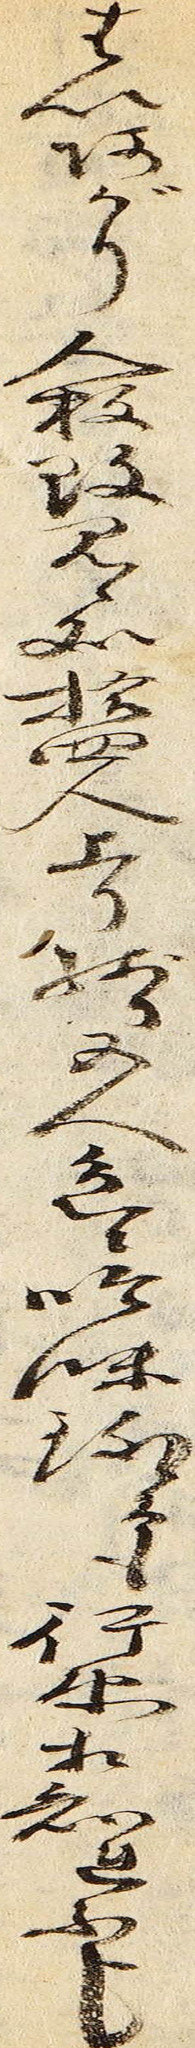はいあがり人数改見候処拾四人上り残り五人色々吟味致候而も行衛相知れ不申候
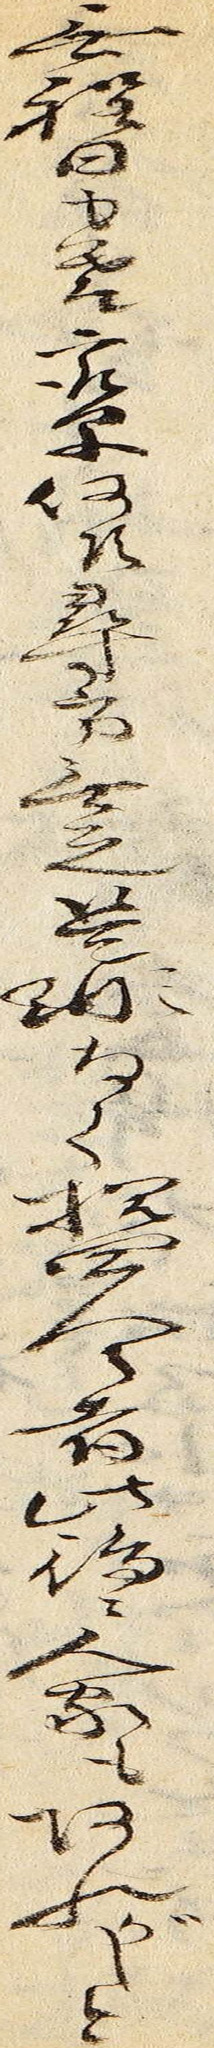無程日も暮最早何共尋方無之是非なく拾四人之者此島に人家もあれがしと
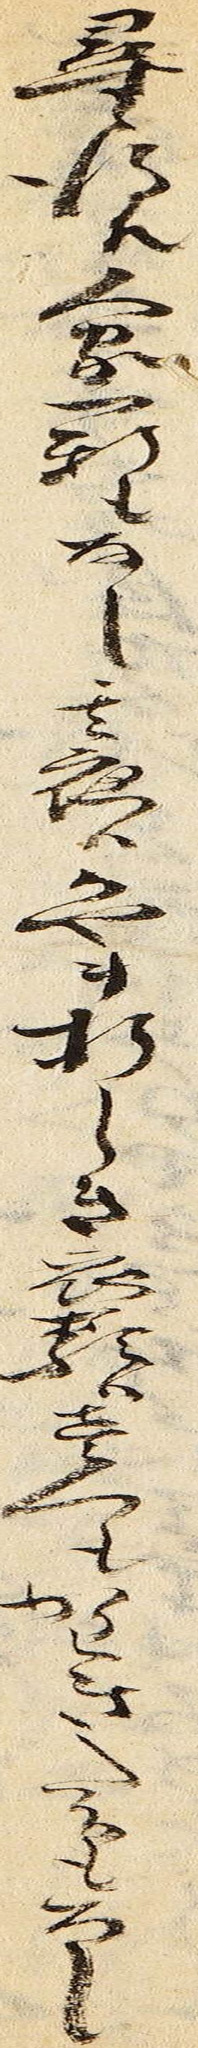尋候得共人家一軒もなし其夜はかやを折しきい衣類は壱つもかわきたるもなし
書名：漂流人物語記
